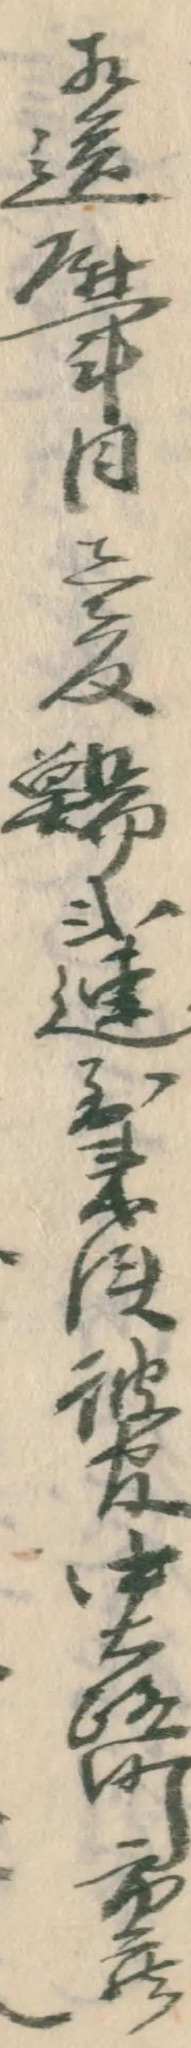相送熨斗目壱反鯣弐連別来段彼官中大路町市蔵
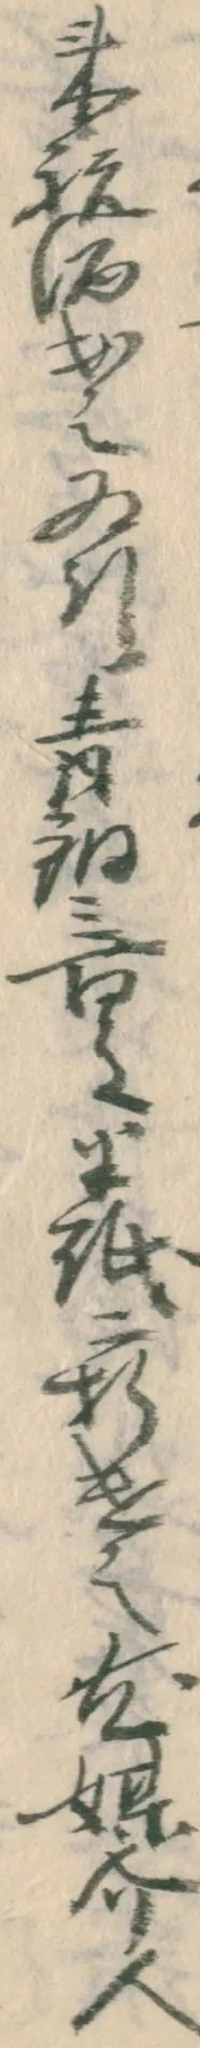来祝酒出之為引青銅三百文半紙二折遣之尤媒介人
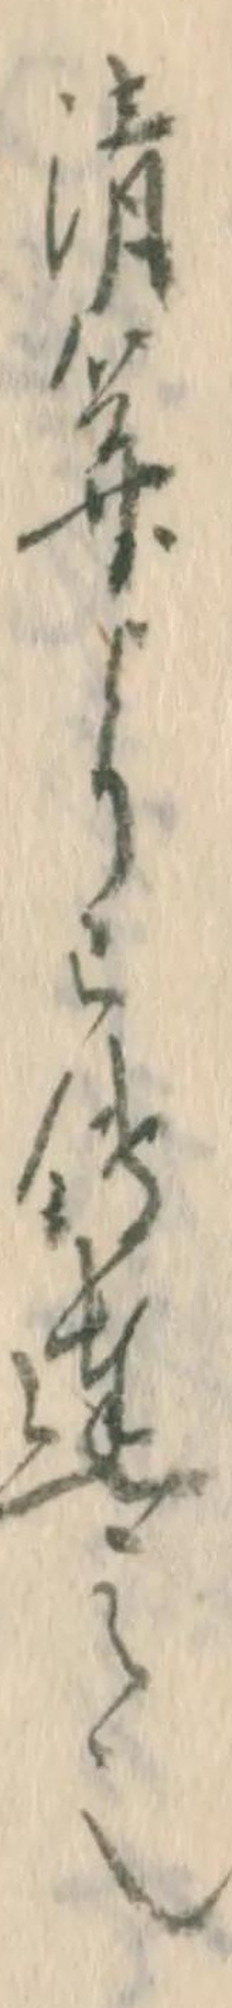清算より被達之也
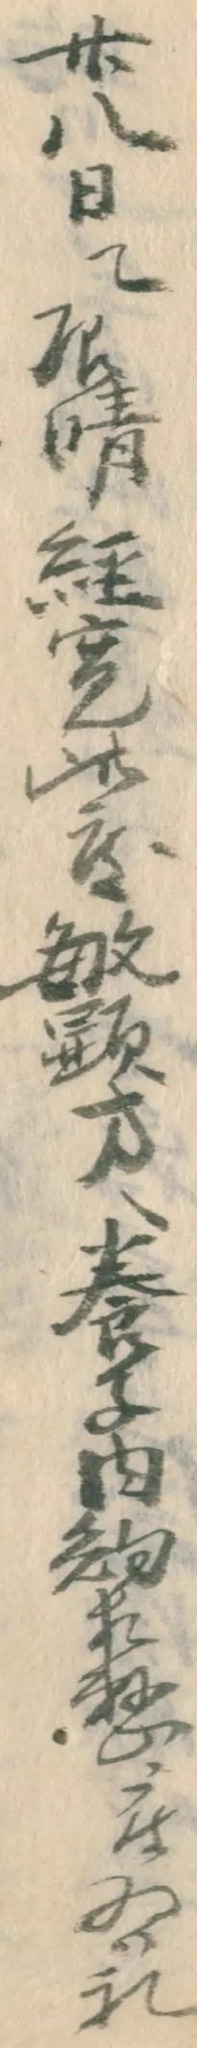廿八日乙辰晴経寛此度敏顕方へ養子内約相整ニ付為御礼
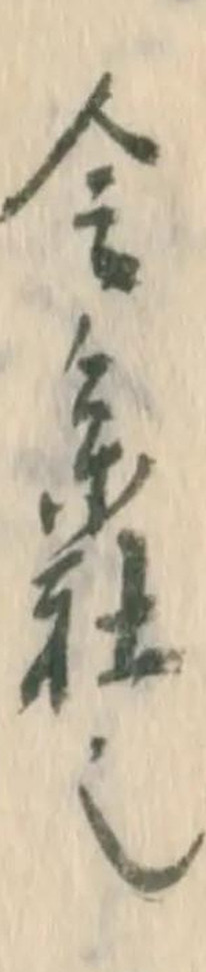令参社也
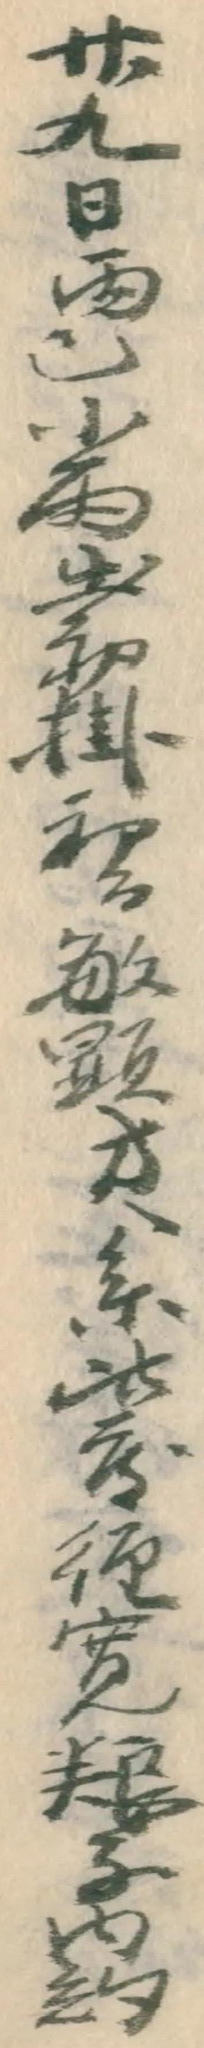廿九日丙巳小雨出勤掛初而敏顕方へ参此度経寛養子内約

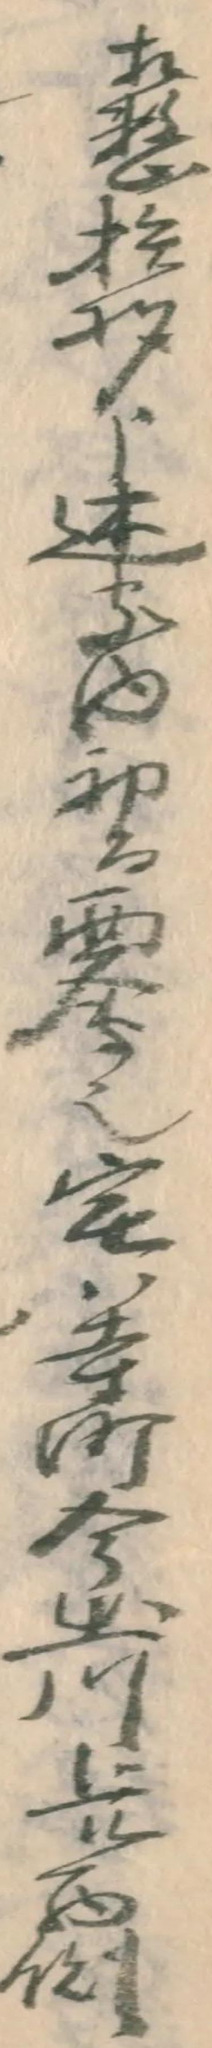相整挨拶申述家内初而面會也宅は寺町今出川上ル西側
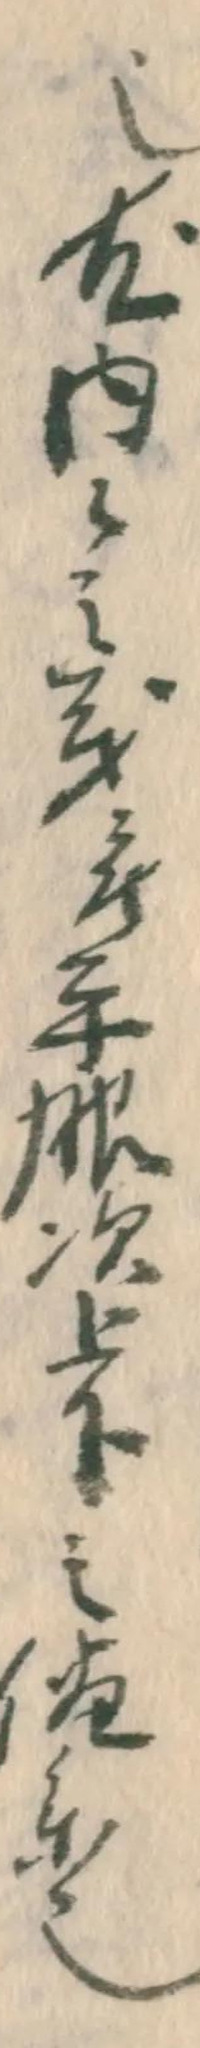也尤内々之義ニ付平服次上下之催参也
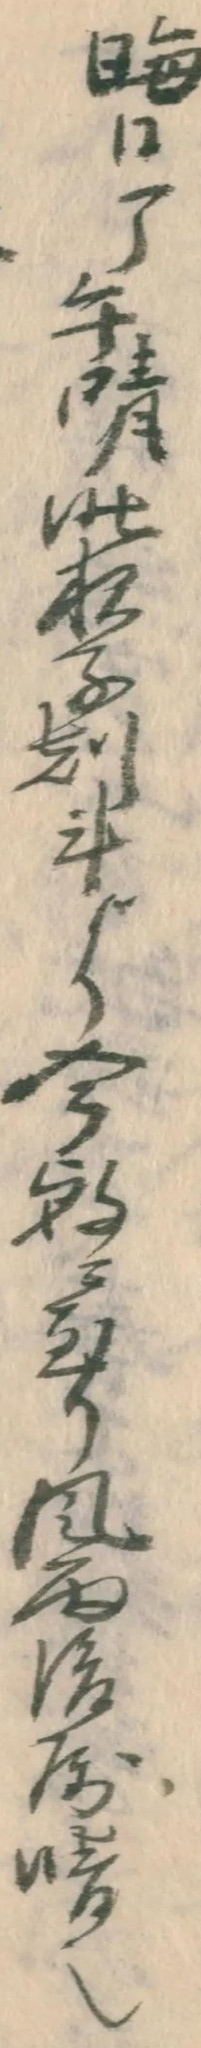晦日丁午晴昨夜子刻斗より今朝に至り風雨後属晴也
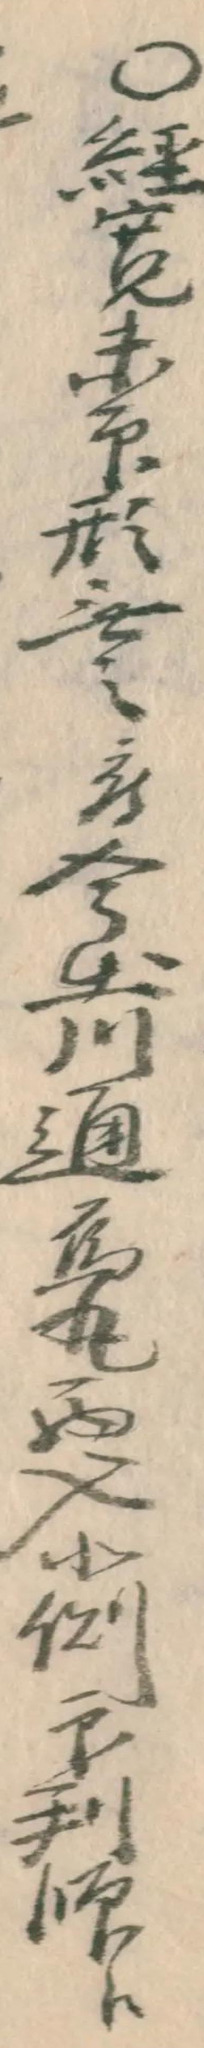○経寛未印形無之ニ付今出川通烏丸西へ入北側印判師え
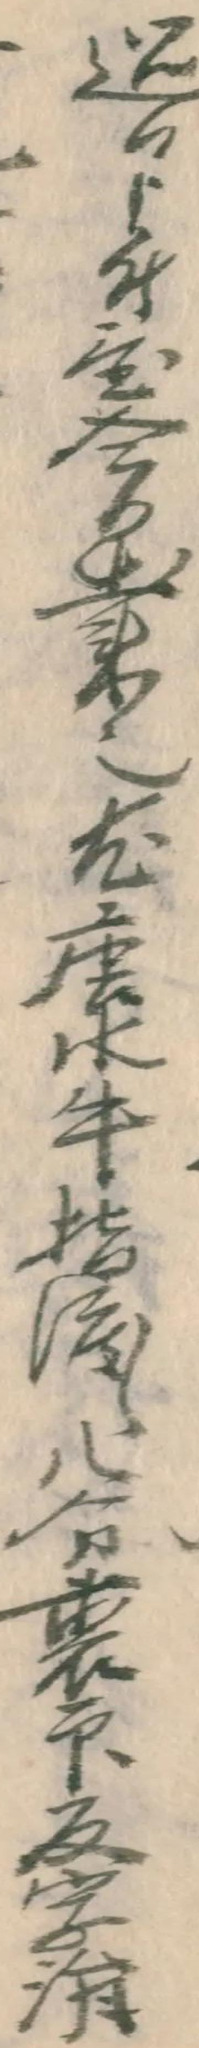過日申付置今日出来也尤唐水牛指渡し八分裏印反字絹
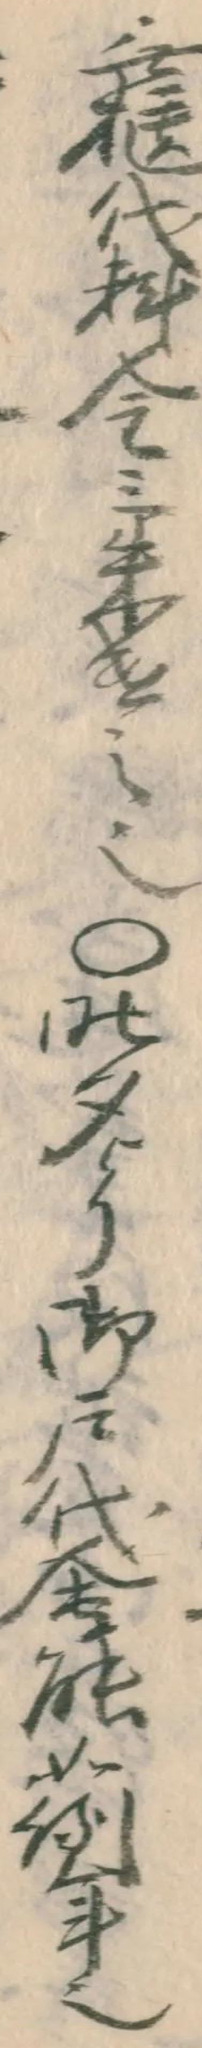無櫃代料金三朱遣之也○昨夕より御戸代會能如例年也
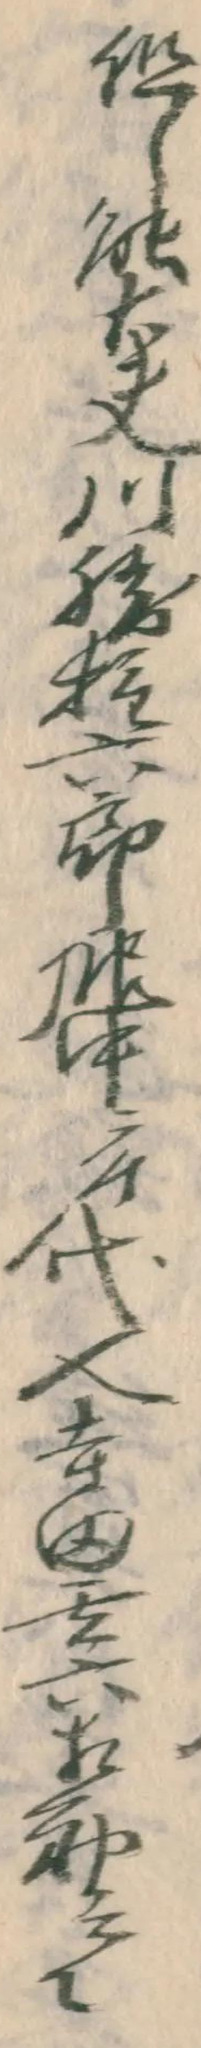但し能大夫川勝権六郎服中ニ付代人寺田玄六相勤云々
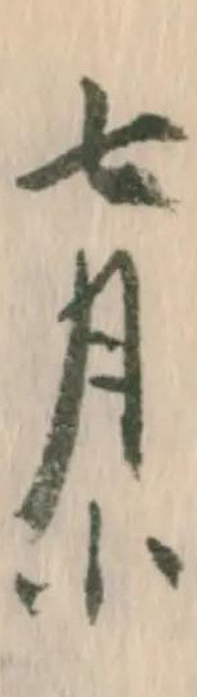七月小
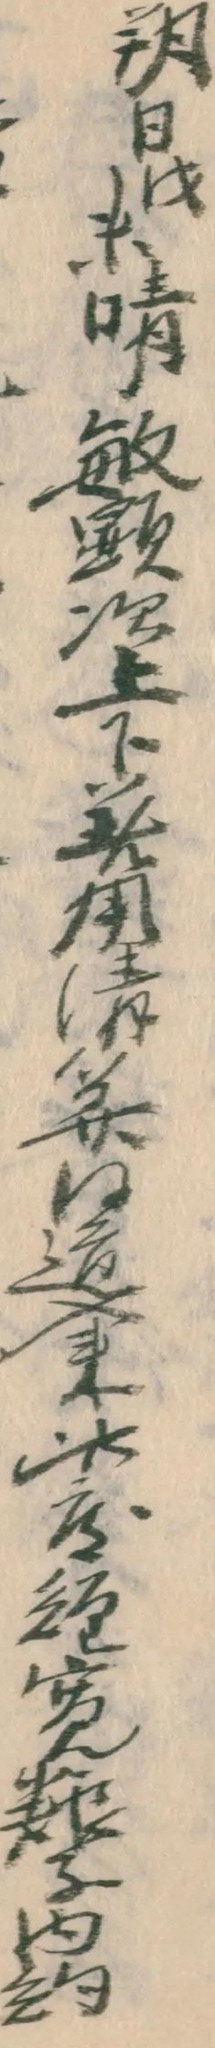朔日戊未晴敏顕次上下着用清算同道入来此度経寛養子内約
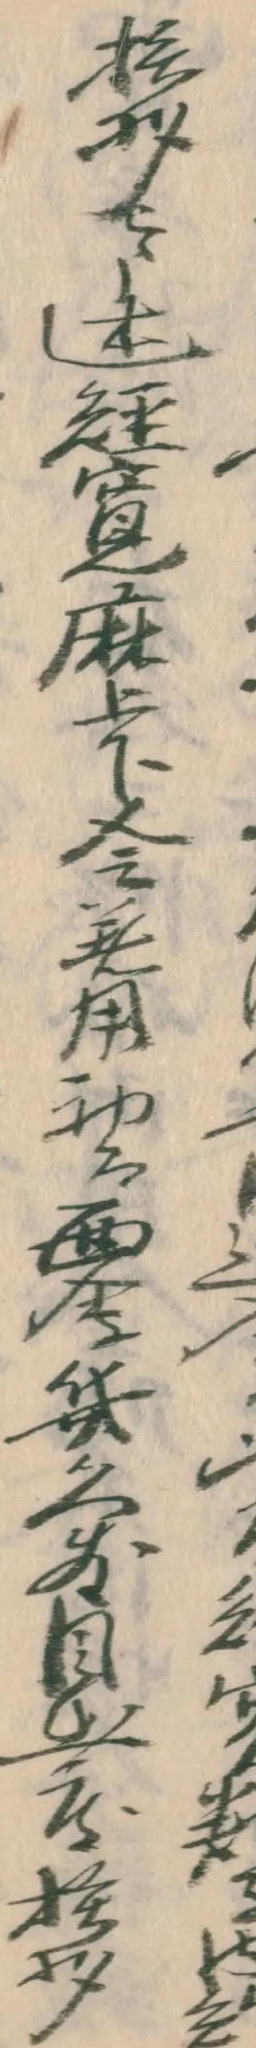挨拶を申述経寛麻上下令着用初而面會弥久敷目出度挨拶
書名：賀茂社記録. 第67冊
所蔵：国立国会図書館 National Diet Library, JAPAN
